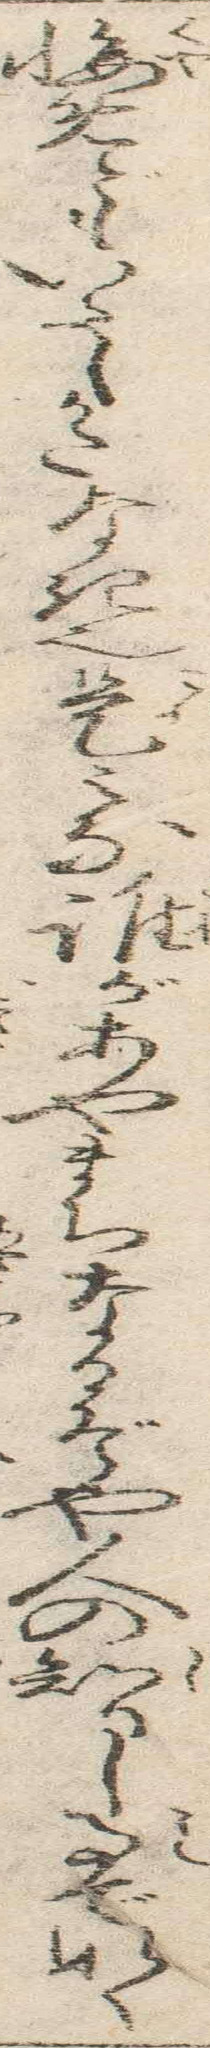悔めどもいたしかたなき也是みな誰があやまちなるぞや人の知りし事ぞなく
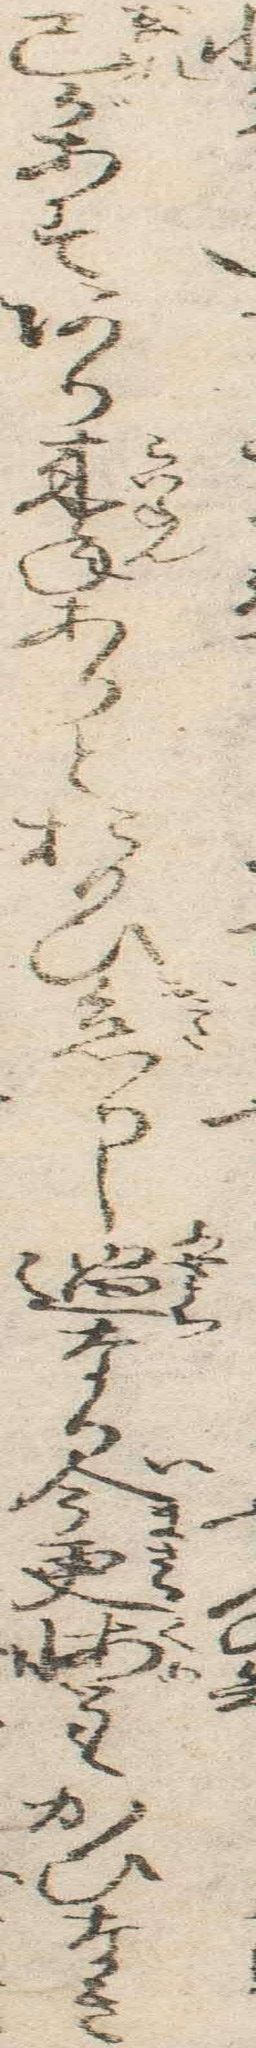己があすあり来年ありとおもひ怠りし過ちなり今更悔ともかひなき
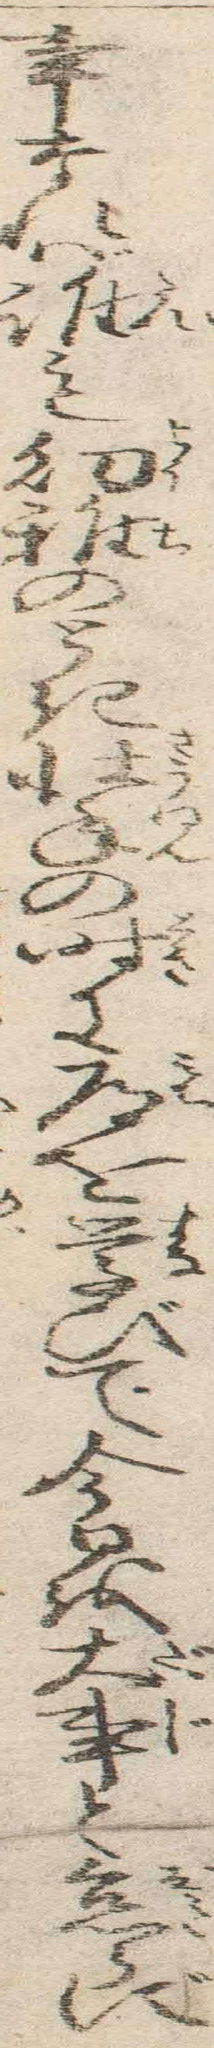事なれば誰も幼稚のとき壮年の時に道を学びて今日を大事と怠らず
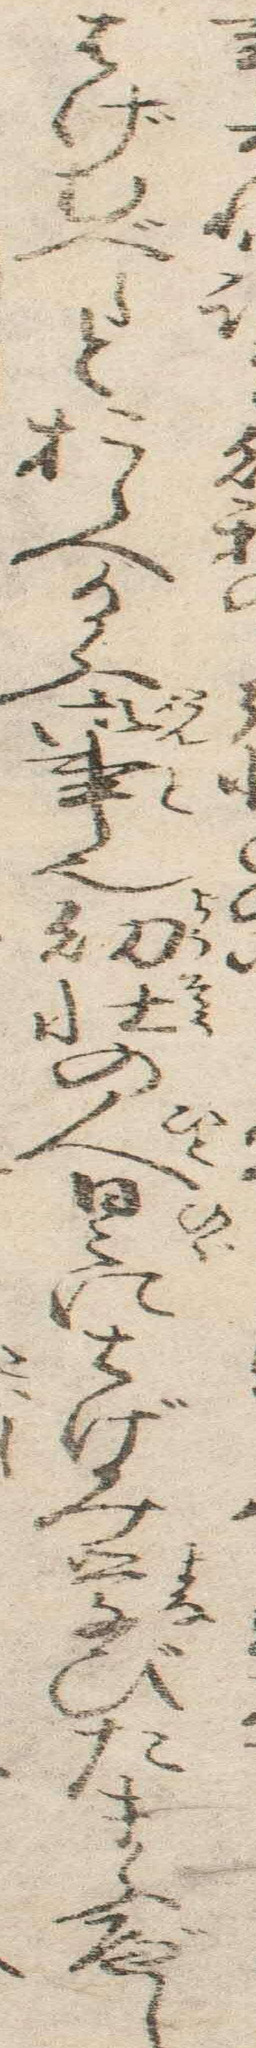はげむべしとおしへ給ふ御事也幼壮の人日々にはげみ学びたまふべし
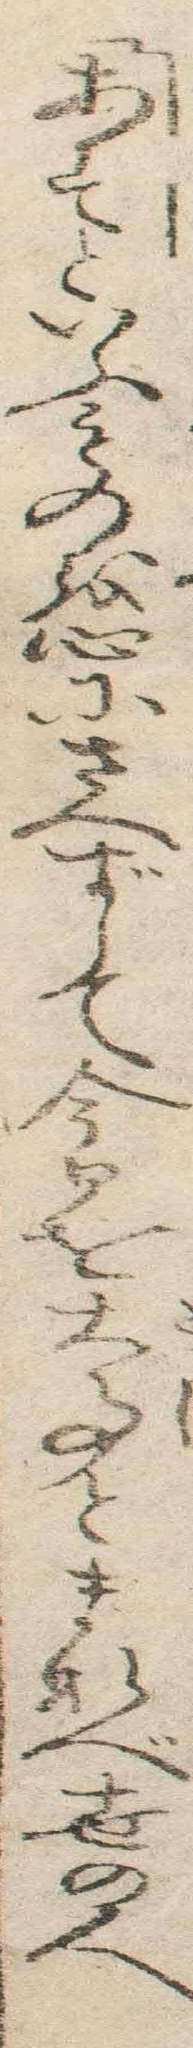〽あすといふものを心にさへずして今日を大事と学べ世の人

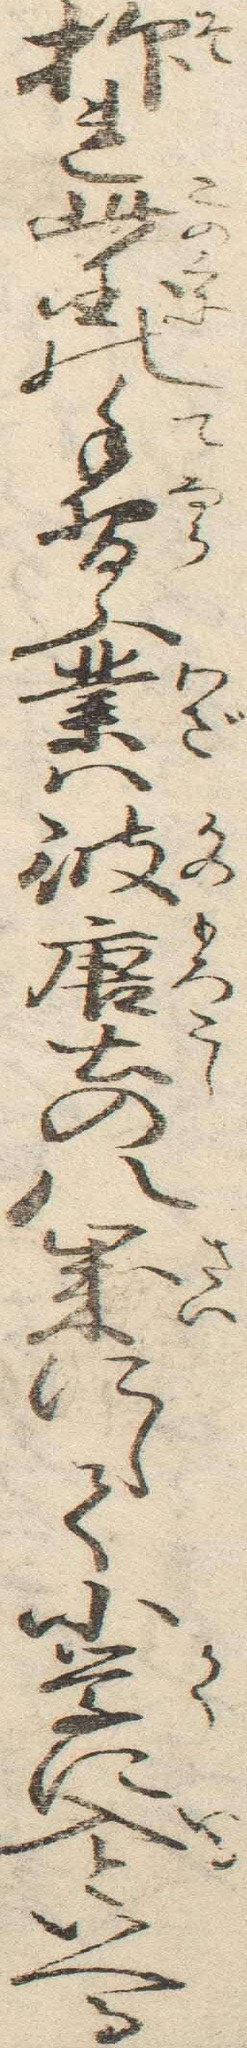抑れ此国の手習ふ業は彼唐土の八歳にして小学に入といへる
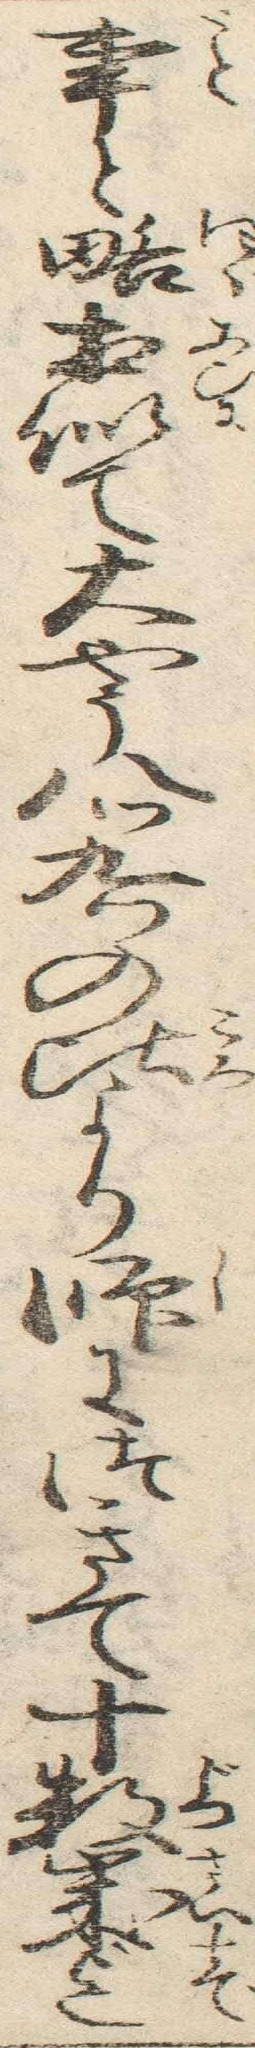事と略相似て大やう八っ九っの比より師につきて十数歳迄
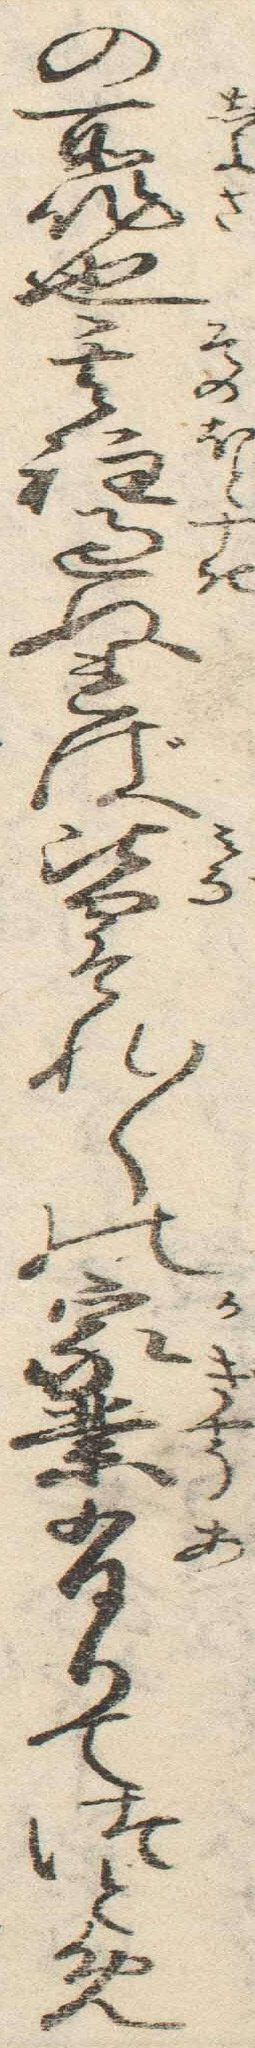の所作也其程過ぬれば皆それ〳〵の家業有りてつとめ
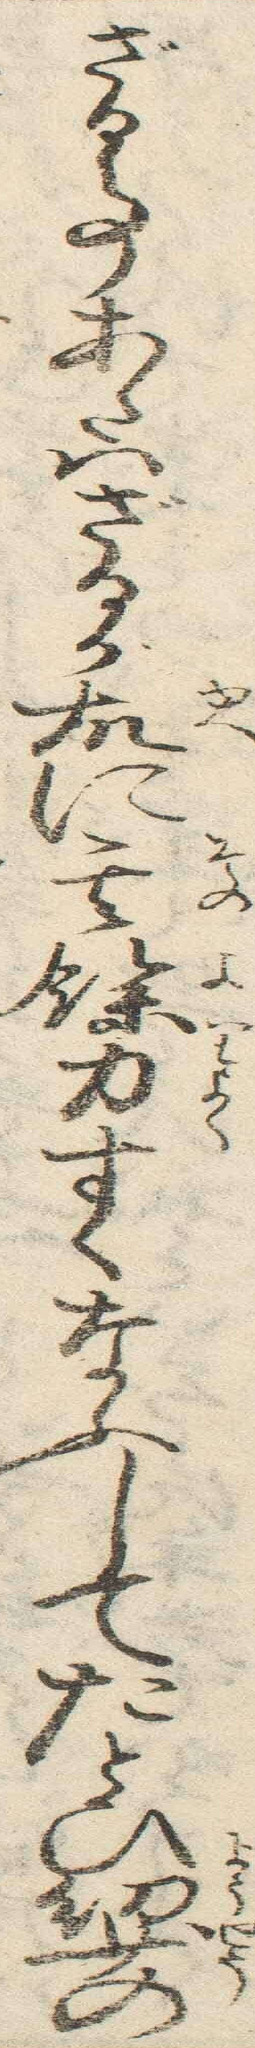ざる事あたはざるか故に其余力すくなふしてたとひ幼少の
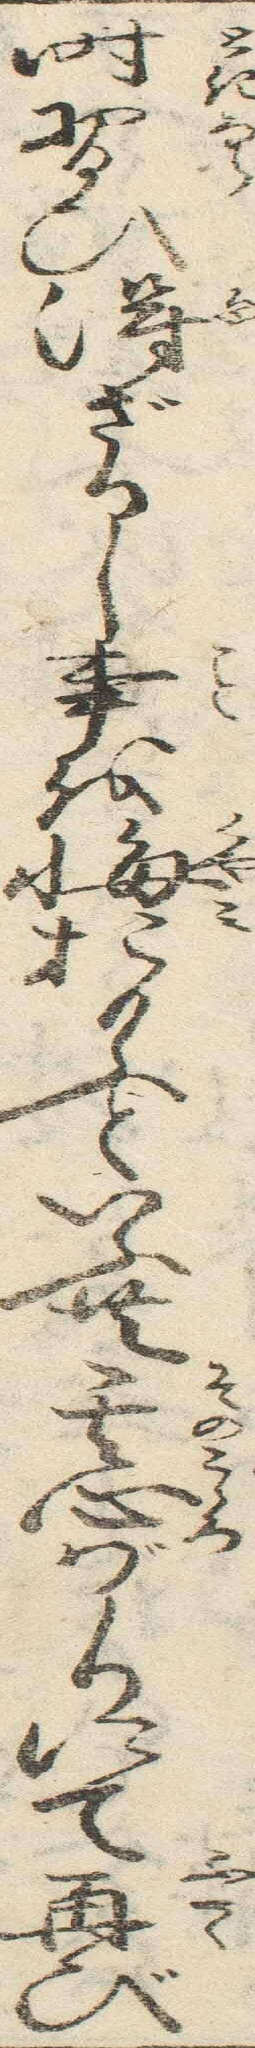時習ひ得ざりし事を悔おもふといふ共其心がらにて再び
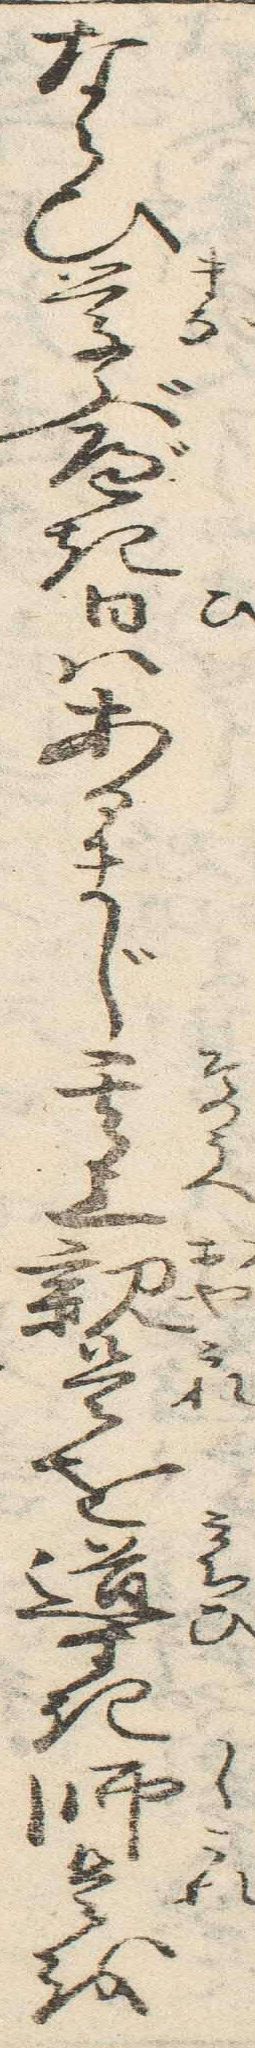ならひ学ぶべき日はあるまじ其上親是を導き師是を
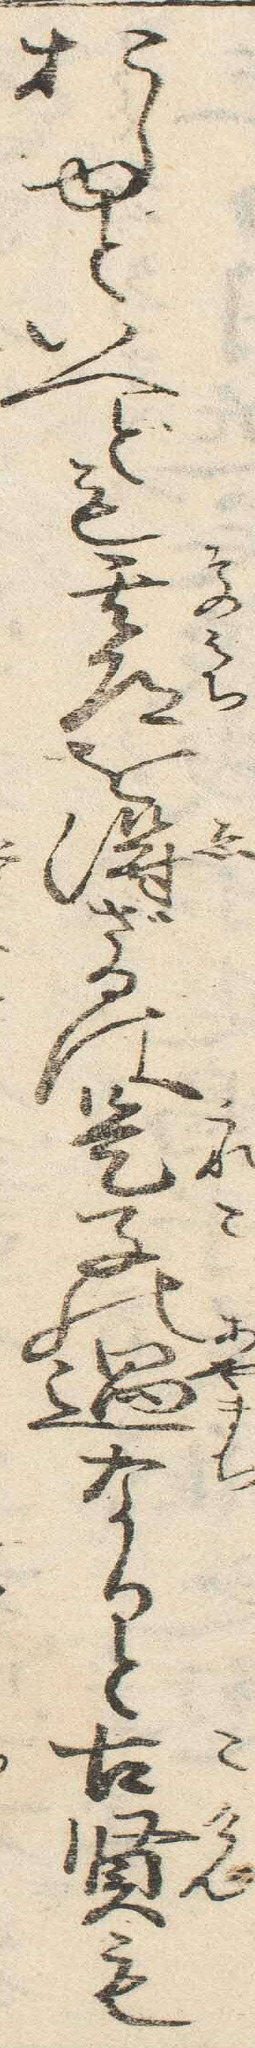おしゆといへども其道を得ざるは是子の過なりと古賢も
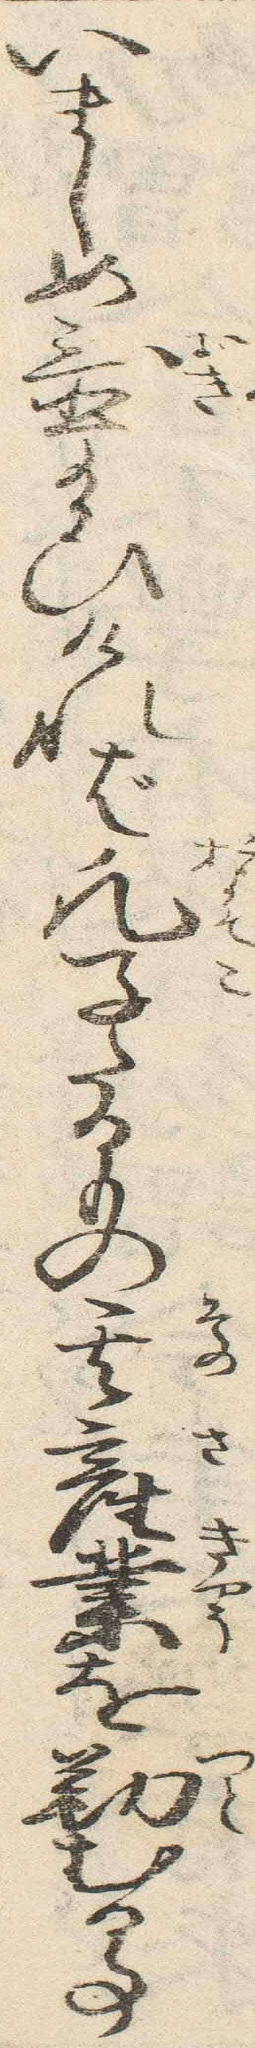いましめ置給ひければ凡子たるもの其産業を勤むる事
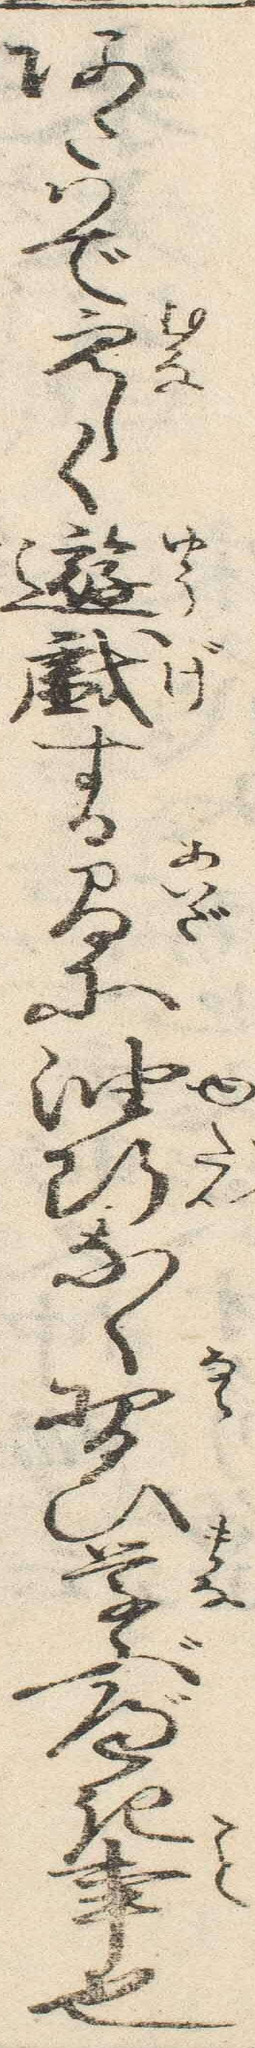あたはで空しく遊戯する間に油断なく習ひ学べき事也
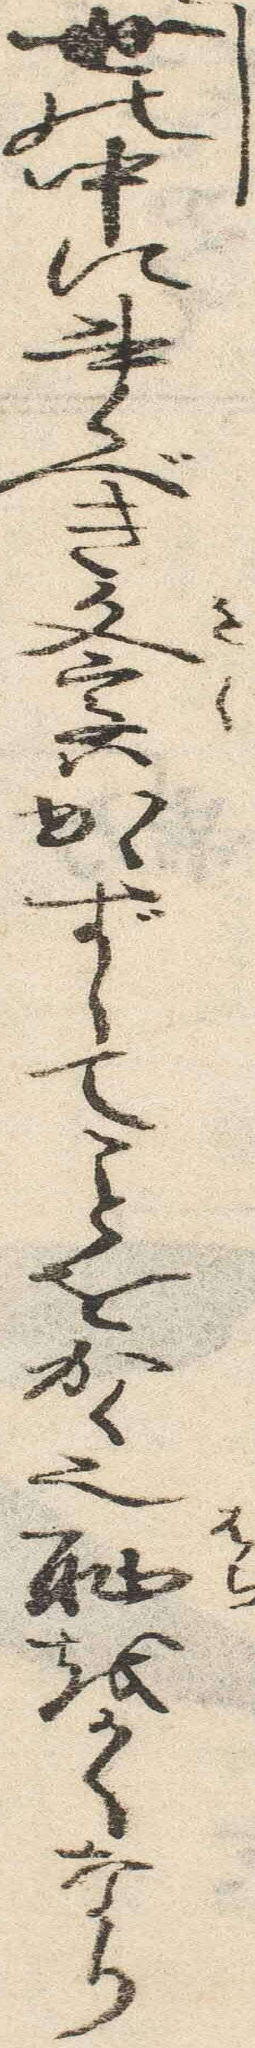〽世の中に書くべき文字はかゝずしてことをかく也恥をかくなり
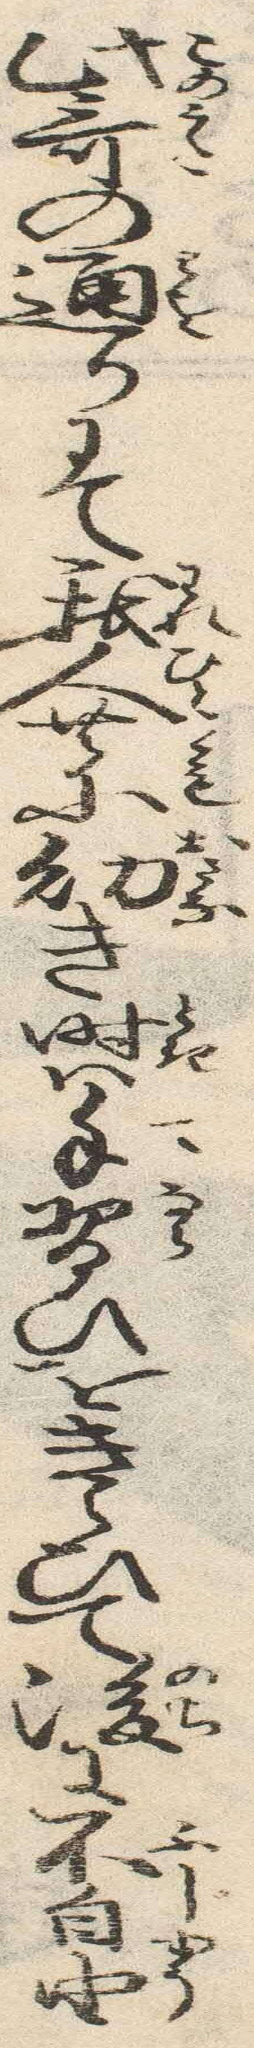此哥の通りにて我人共に幼き時は手習ひをきらひて後に不自由
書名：撫育草
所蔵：東京学芸大学附属図書館 国文学研究資料館
